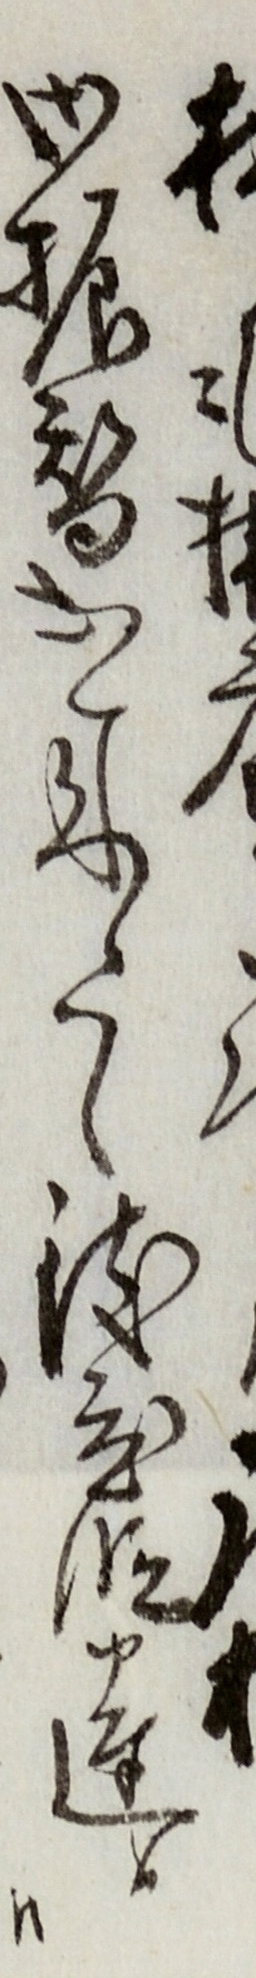御振替出来候ハヽ致度段申達候
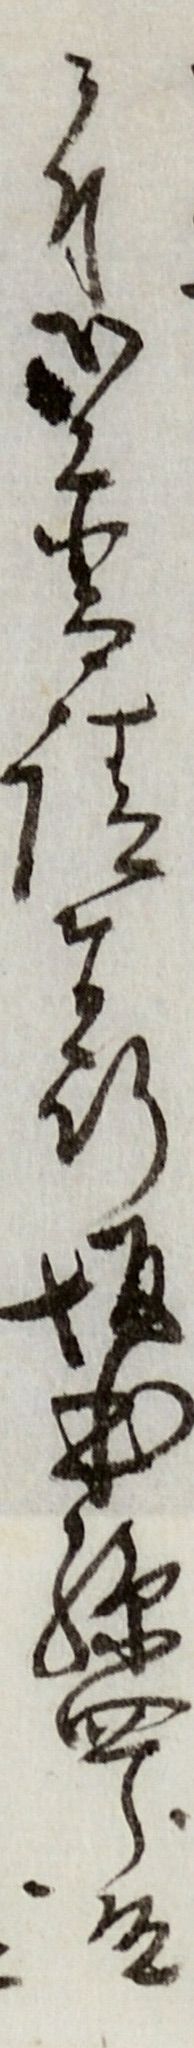ニ付御普請奉行坂本孫四郎殿江
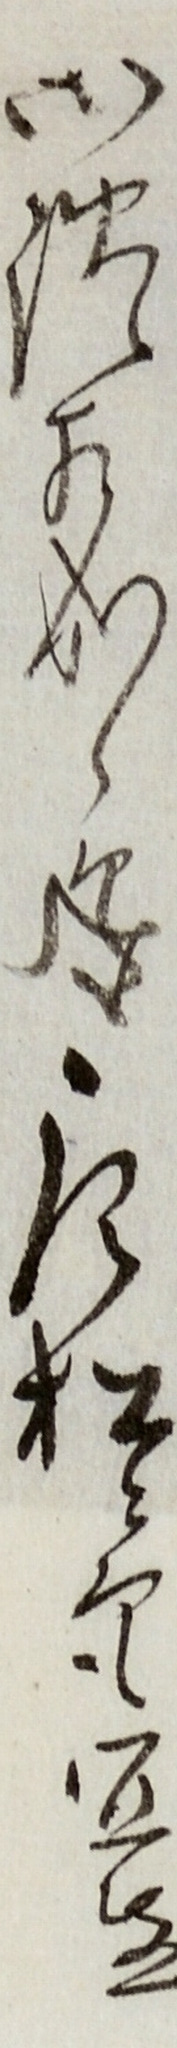御談相成候処唐松ニ而も宜敷
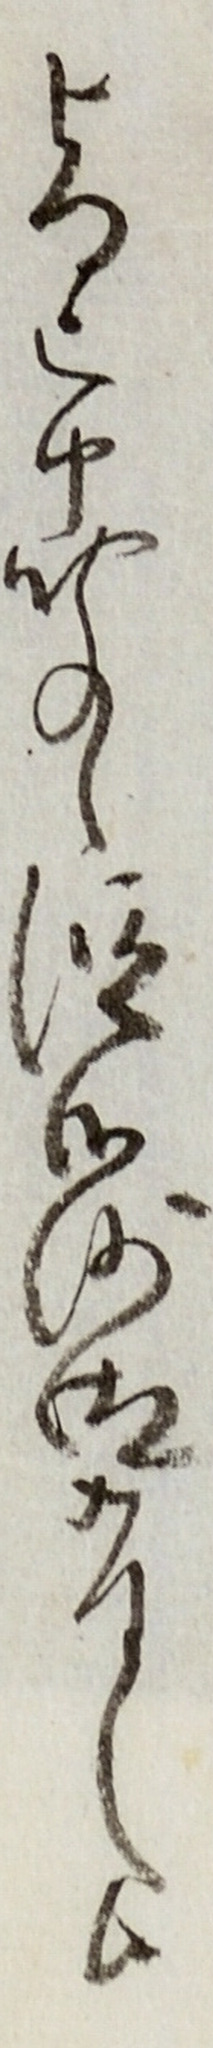旨被申聞候段御沙汰有之候
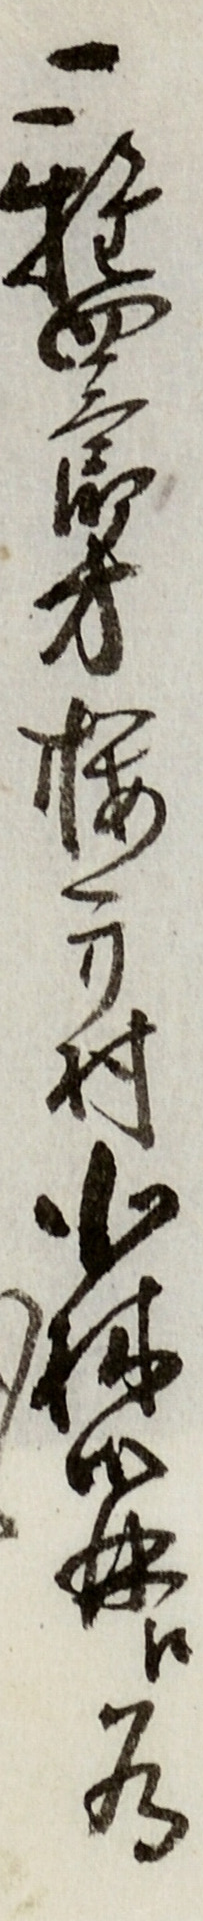一雅四郎方桜井村北林御林江為
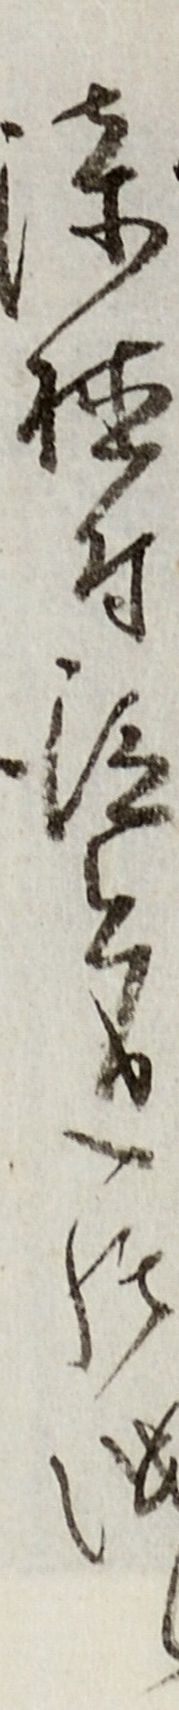漆植付従今日罷越候
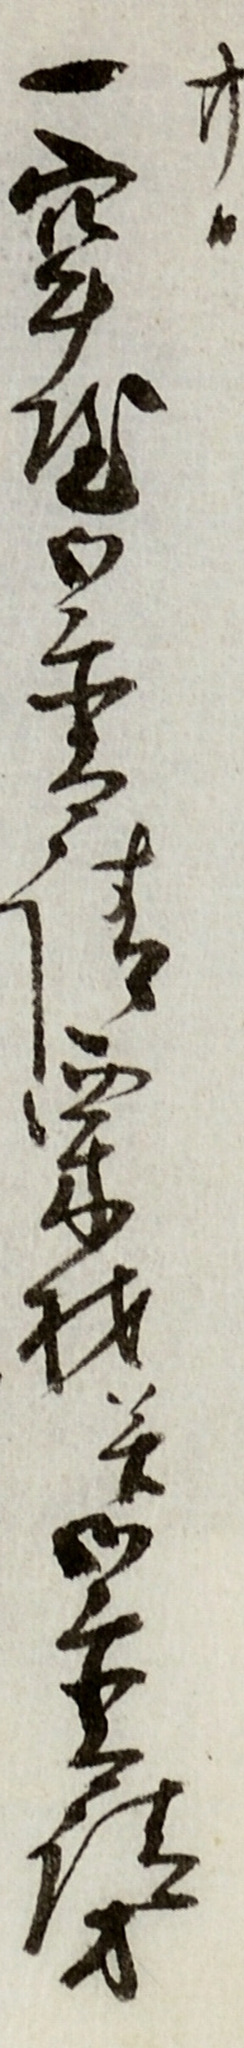一牢屋御普請栗材幷御普請方
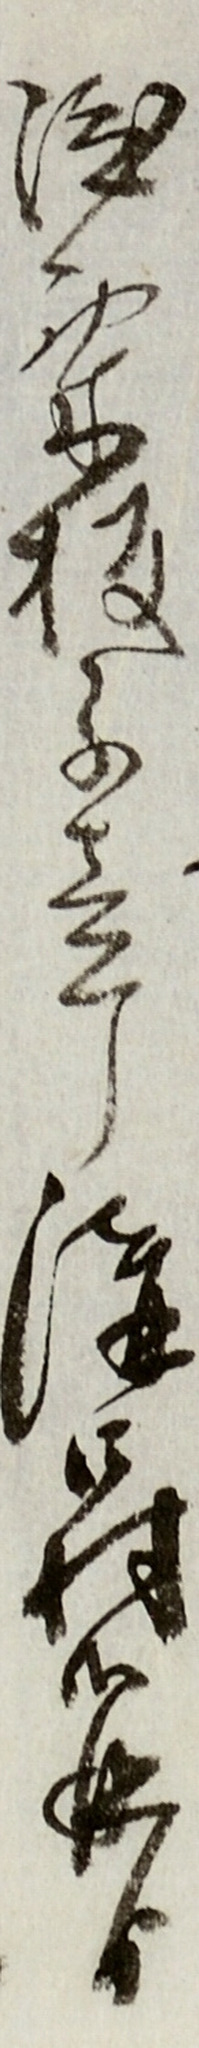渡栗板子壱丁溝口村御林ゟ
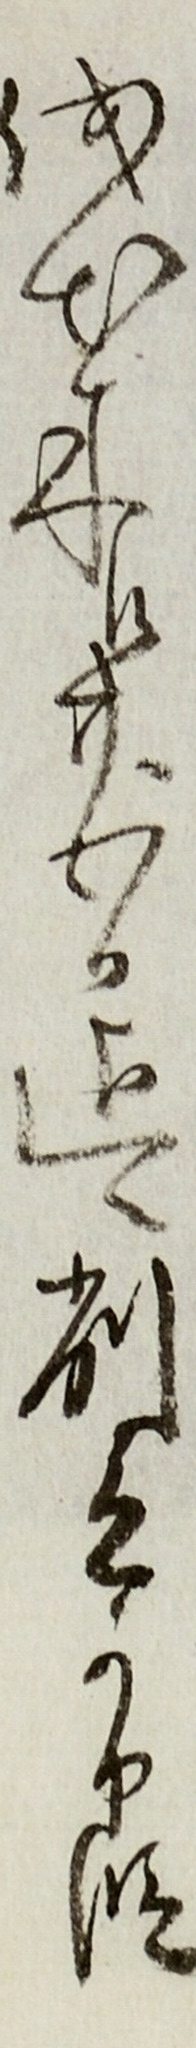伐出来ル廿五日迄ニ削立可申段
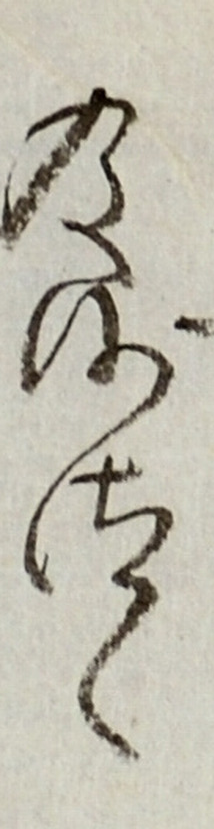及沙汰候
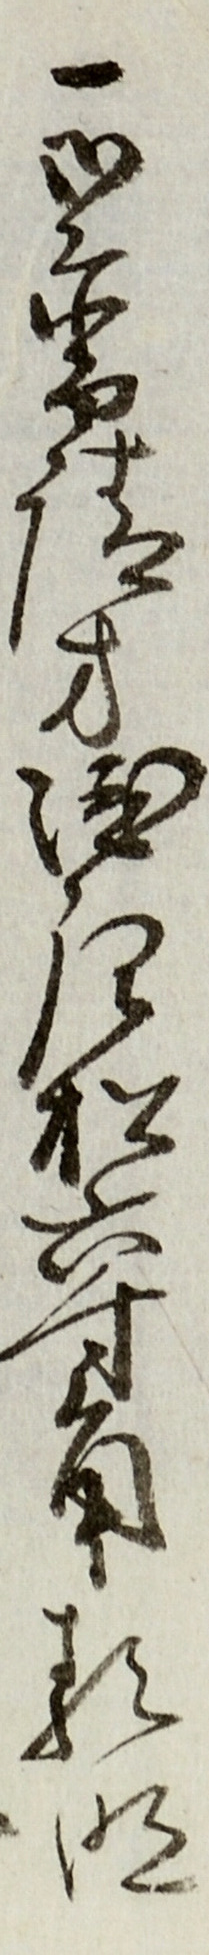一御普請方渡唐松六寸角類明
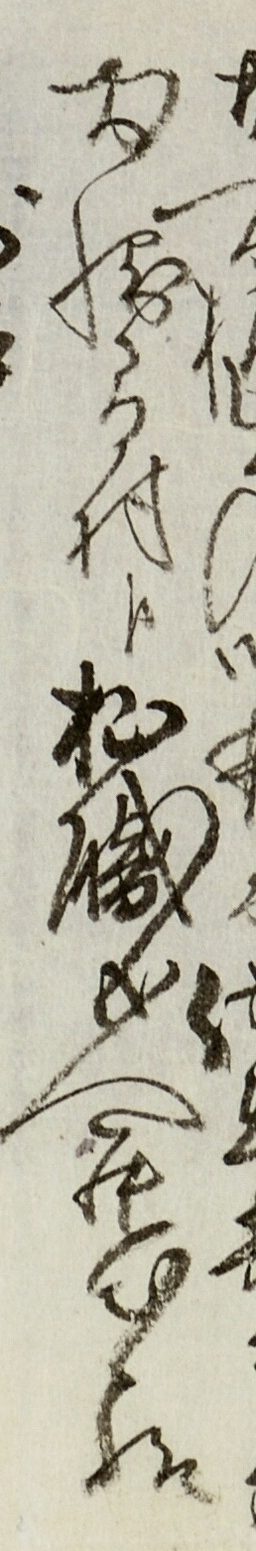両勝間村江杣職弐人罷出候様
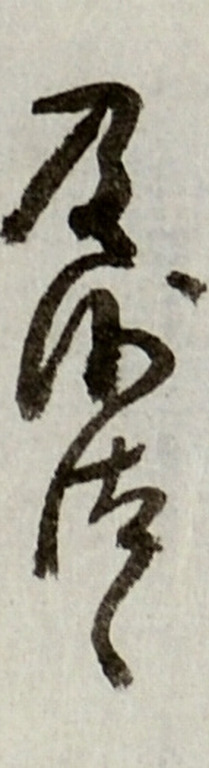及沙汰候
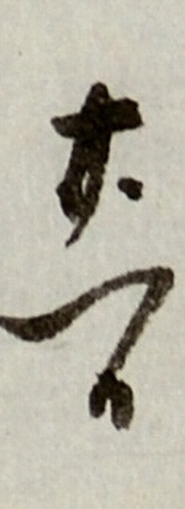廿一日
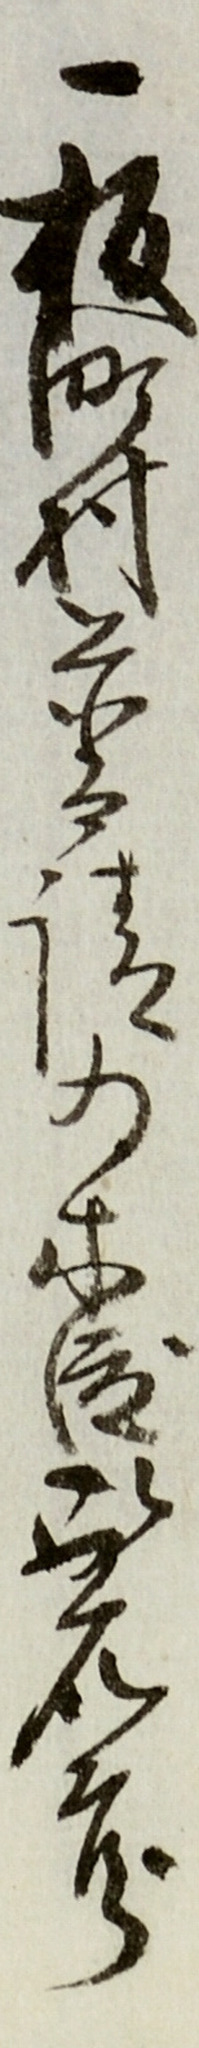一板町村普請為木渡麗蔵
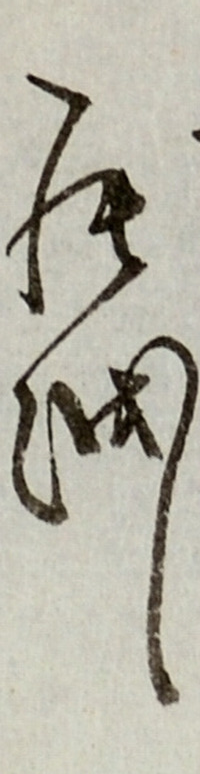罷越候
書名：御山方御薪方諸事御用留
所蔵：伊那市立高遠町図書館・合同会社AMANE
